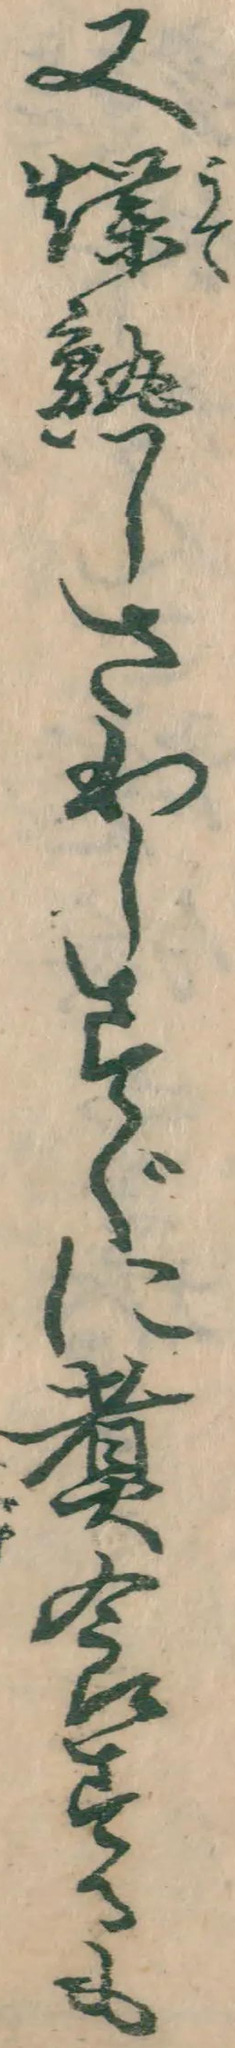又爛熟しさわしすぐに煮食するも

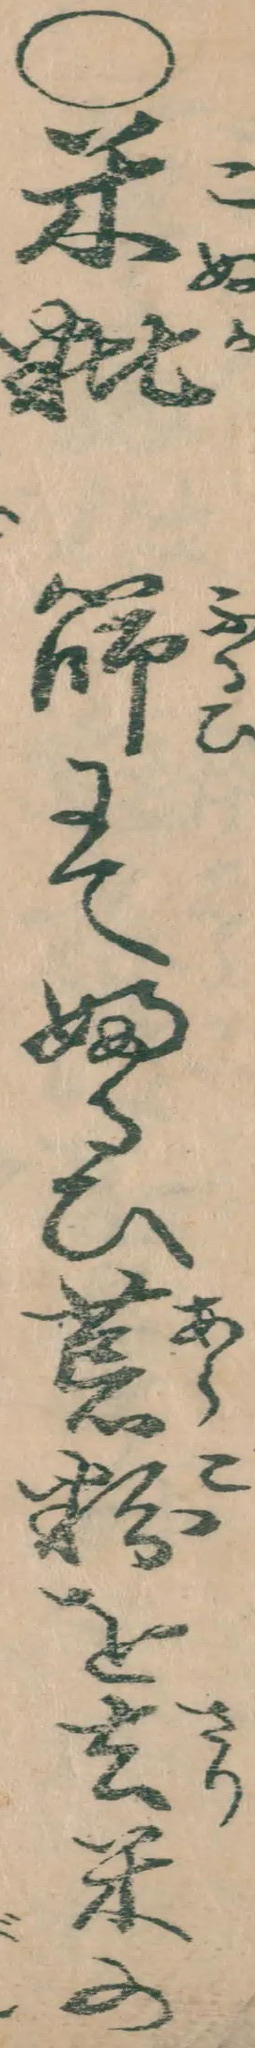〇米糀篩にてふるひ荒粉を去り米の
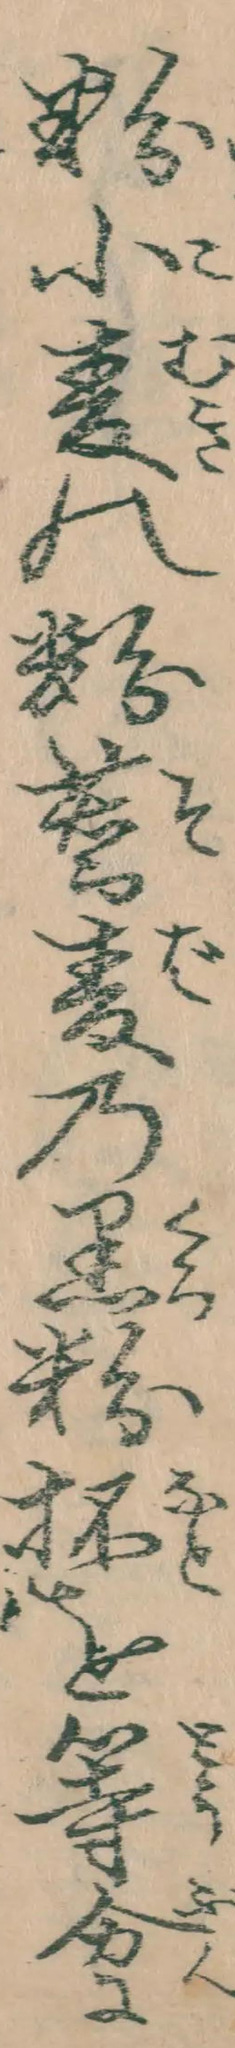粉に小麦の粉蕎麦の黒粉抔を等分に
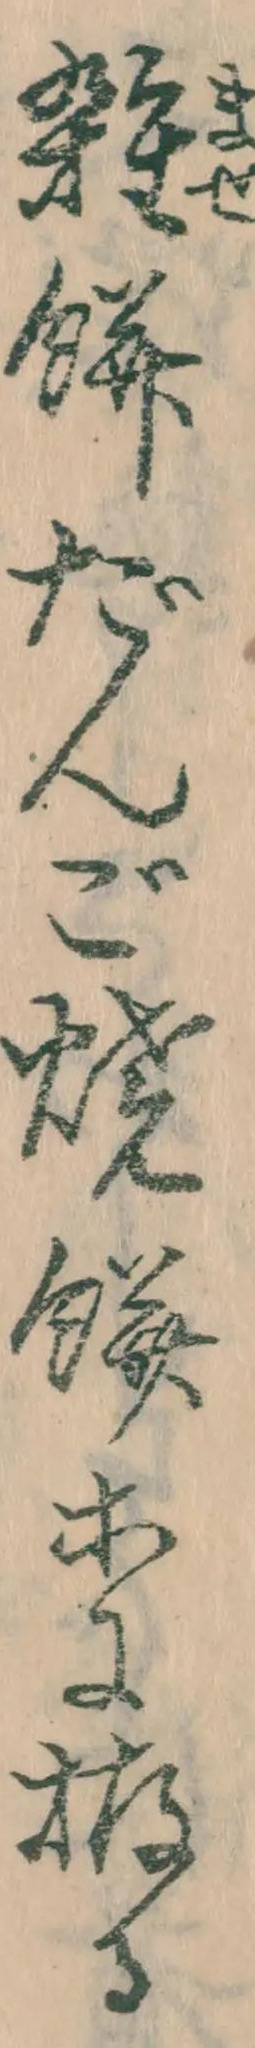雑餅だんご焼餅等に拵る
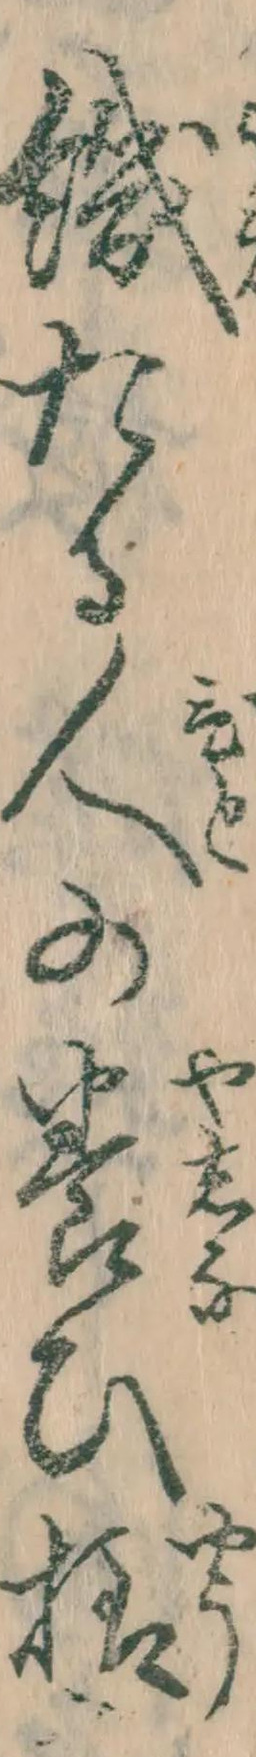餓たる人の養ひ様
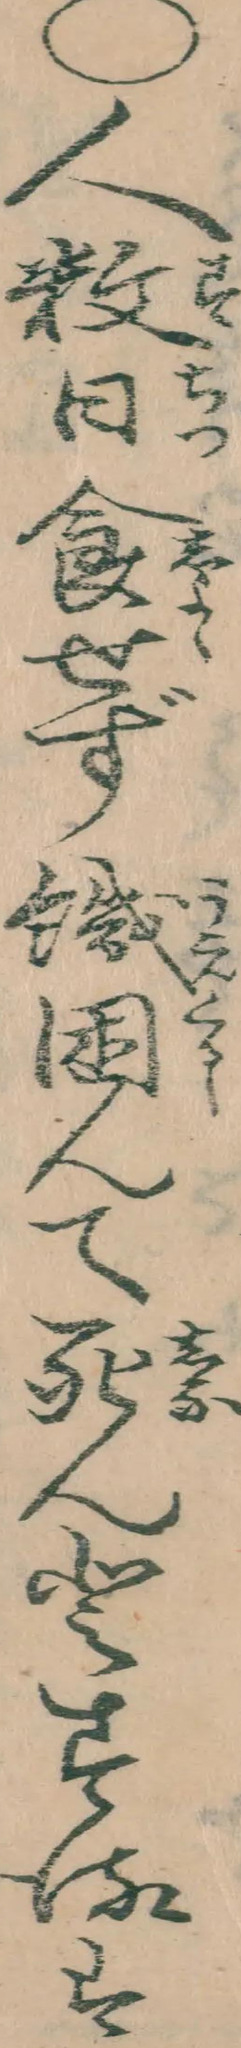〇人数日食せず餓困んて死んとするは
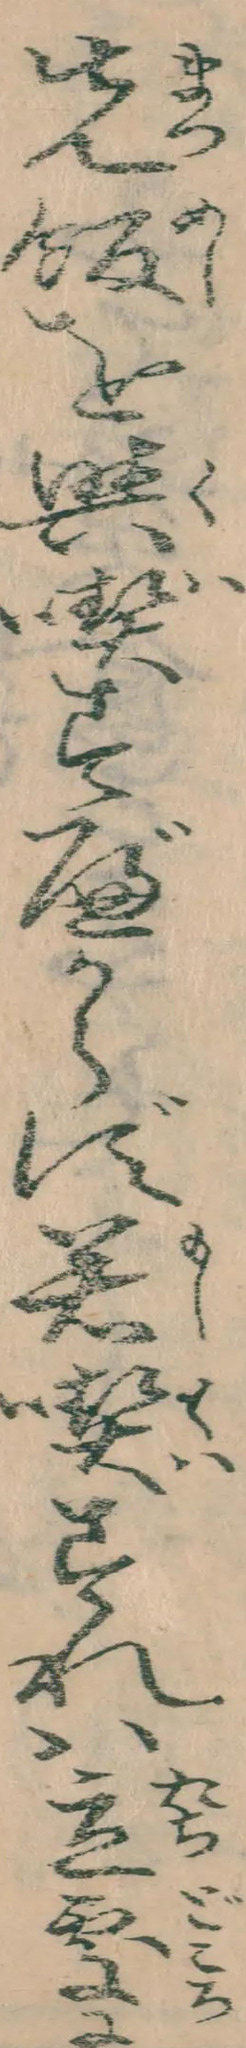先飯を與喫すべからず若喫すれは立処に
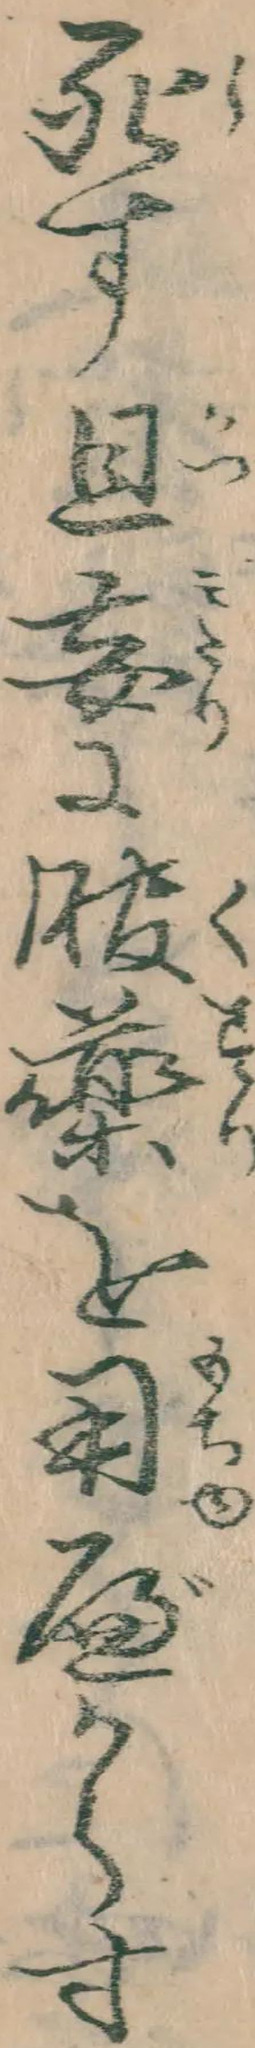死す且妄に服薬を用べからす
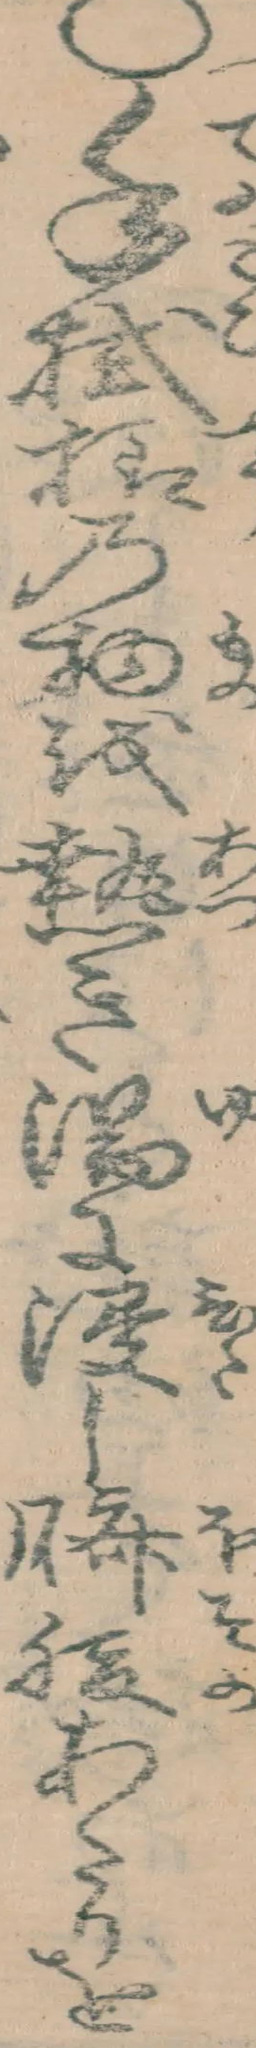〇手拭様の物を熱き湯に浸し臍腹あたりを
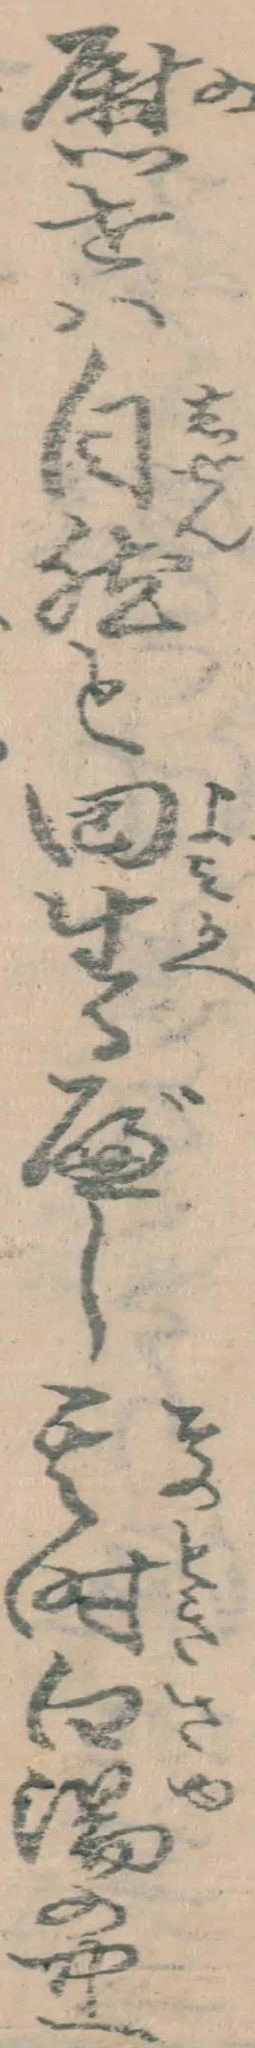熨せは自然と囘生るべしその時白湯の中へ
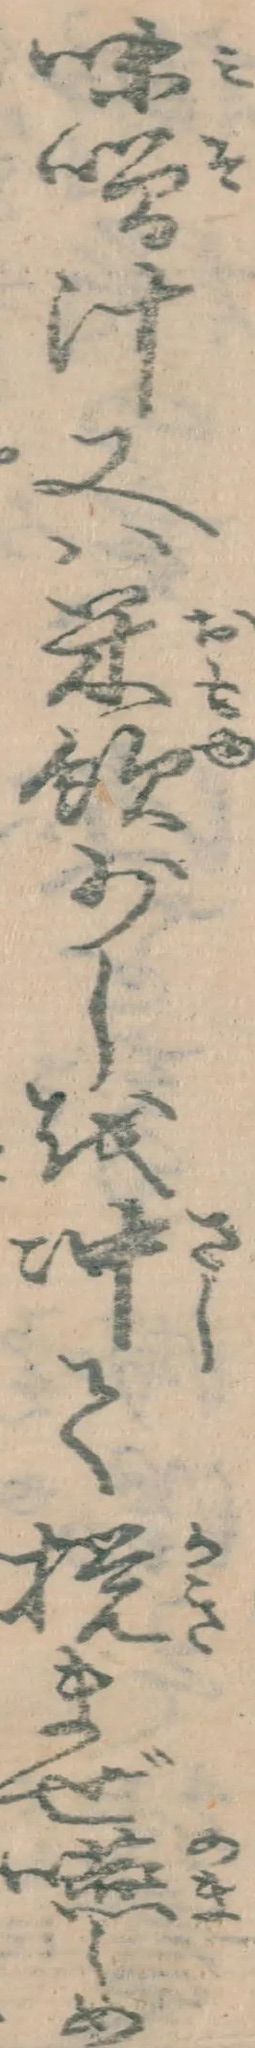味噌汁又は米飲少しを冲て撹まぜ嚥しめ
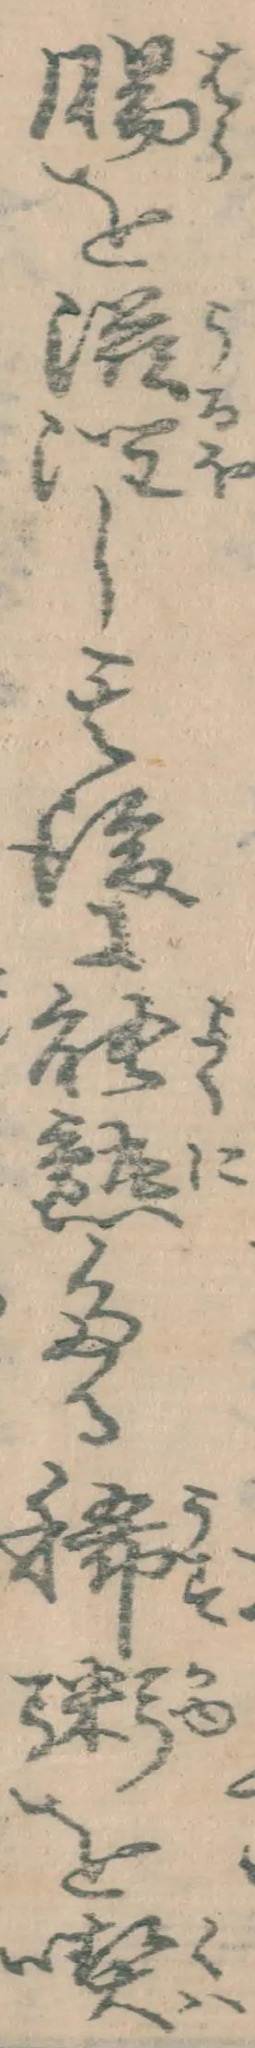腸を滋潤しその後能熟たる稀粥を喫
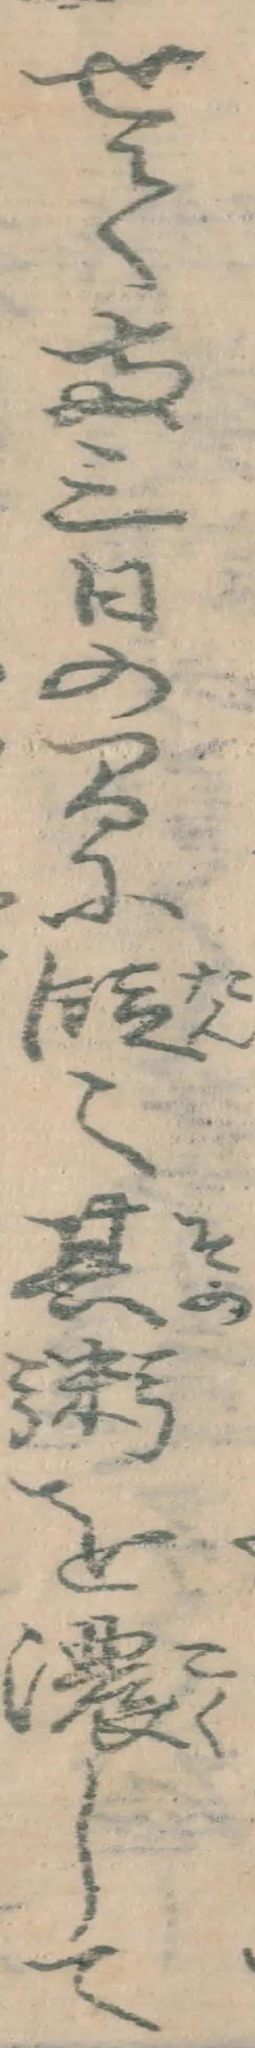せて両三日の間に段々その粥を濃して
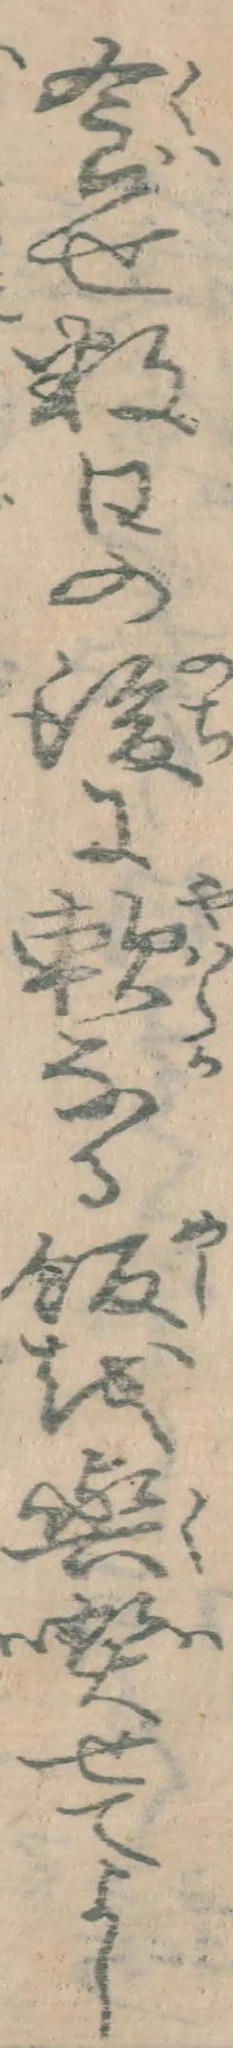食せ数日の後に軟なる飯を與喫せてよし
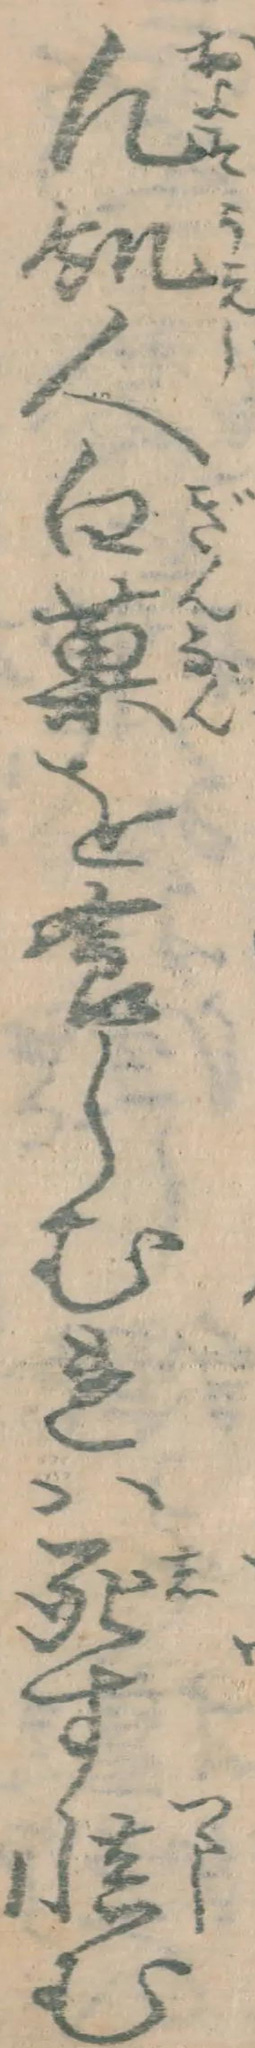凡飢人白菓を食しむれは死す慎む

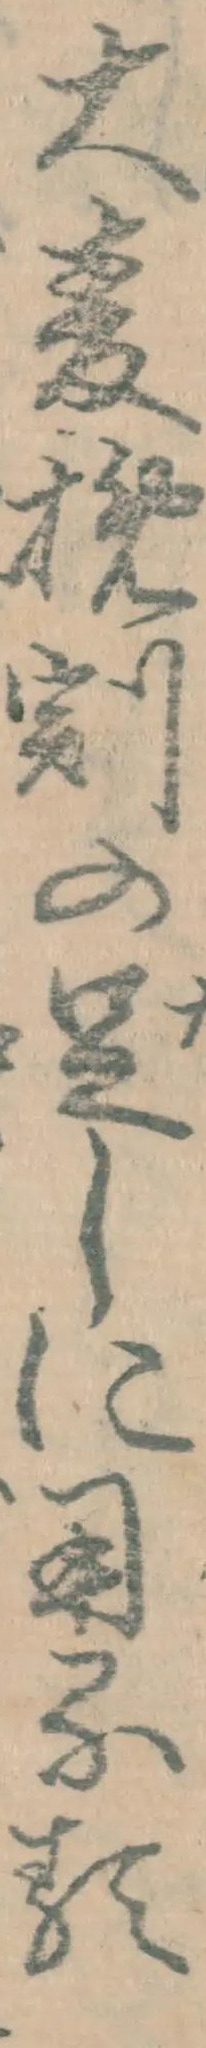大麦挽割の足しに用る類
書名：救荒鄙諭
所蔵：国立国会図書館 National Diet Library, JAPAN
